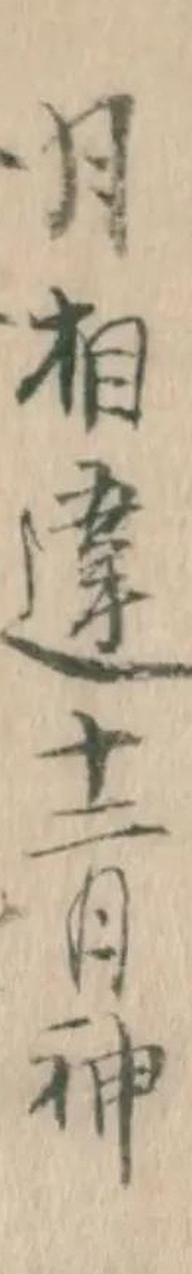月相違十二月神
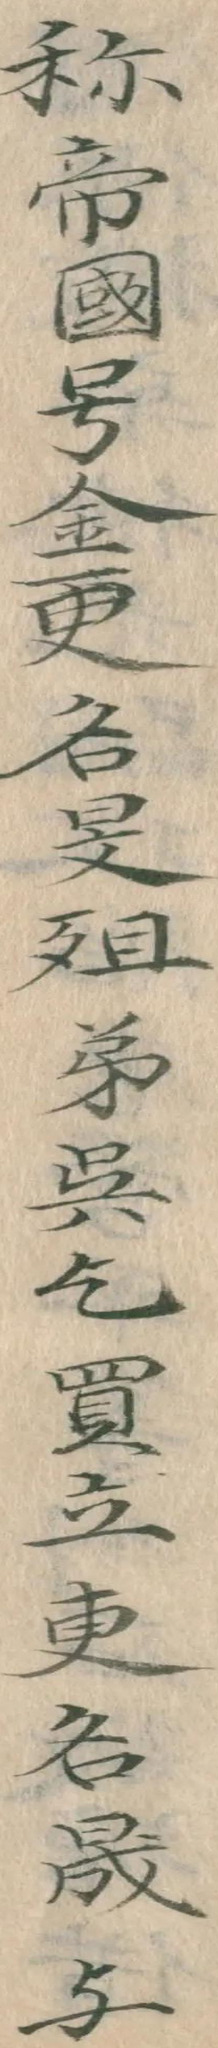称帝国号金更名旻殂弟呉乞買立更名晟与
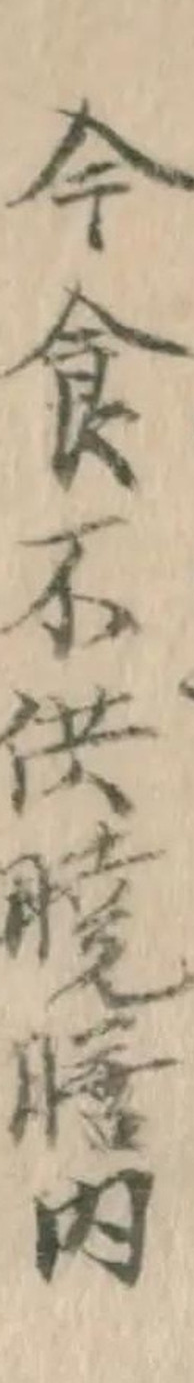今食不供暁膳内
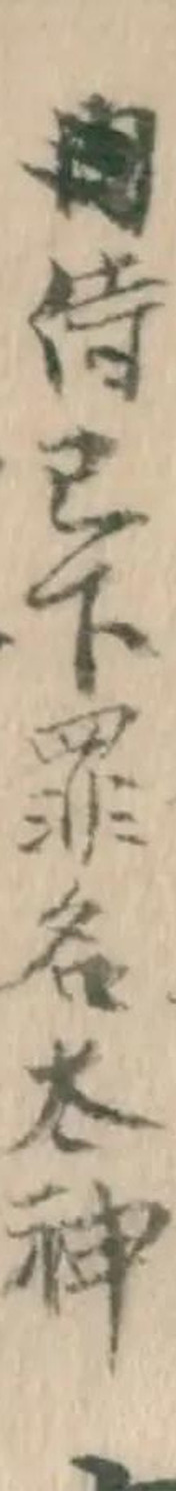侍已不罪名太神
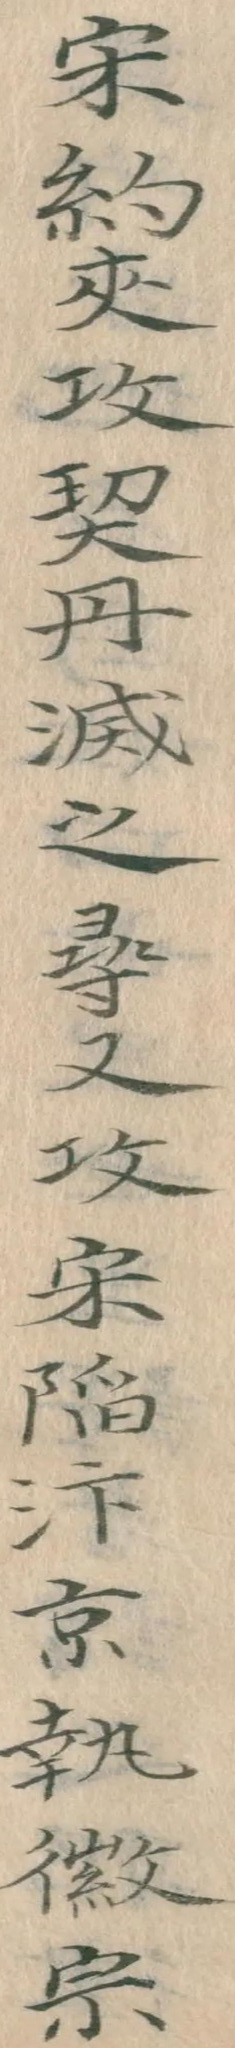宋約夾攻契丹滅之尋又攻宋陥汴京執微宗
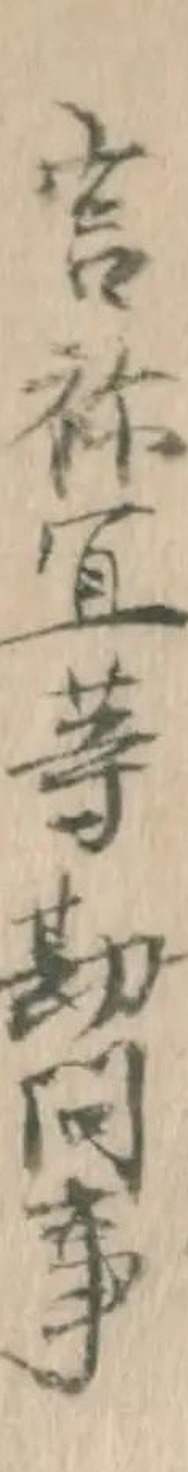宮祢宜等勘問事
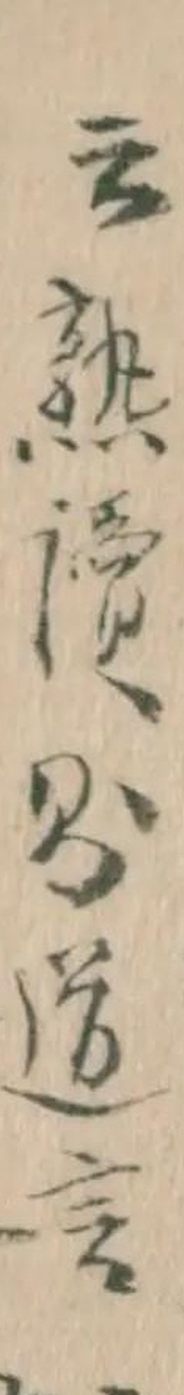云熟読道言
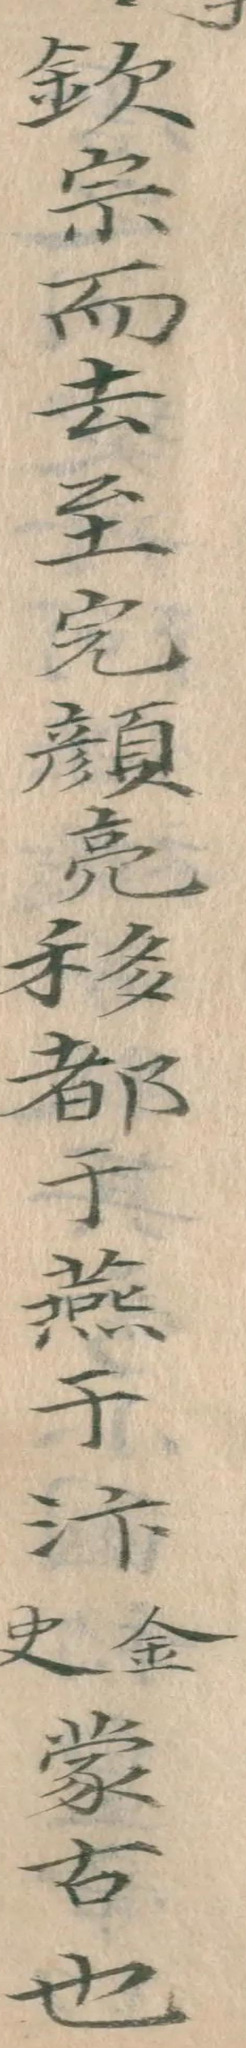欽宗而去至完顔亮移都于燕于汴金史蒙古也
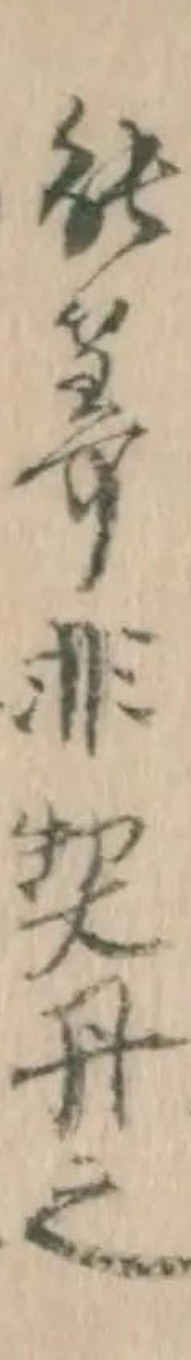能等非契丹也
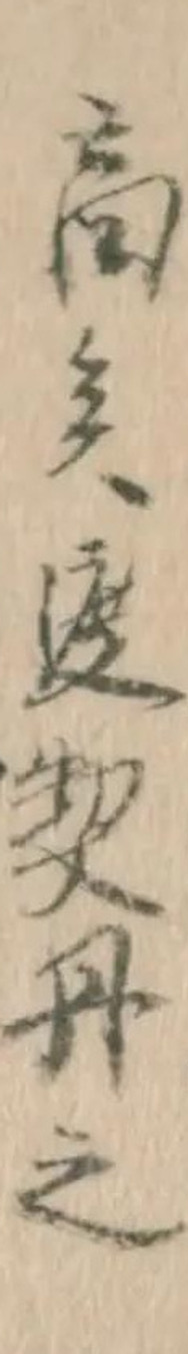商美渡契丹也
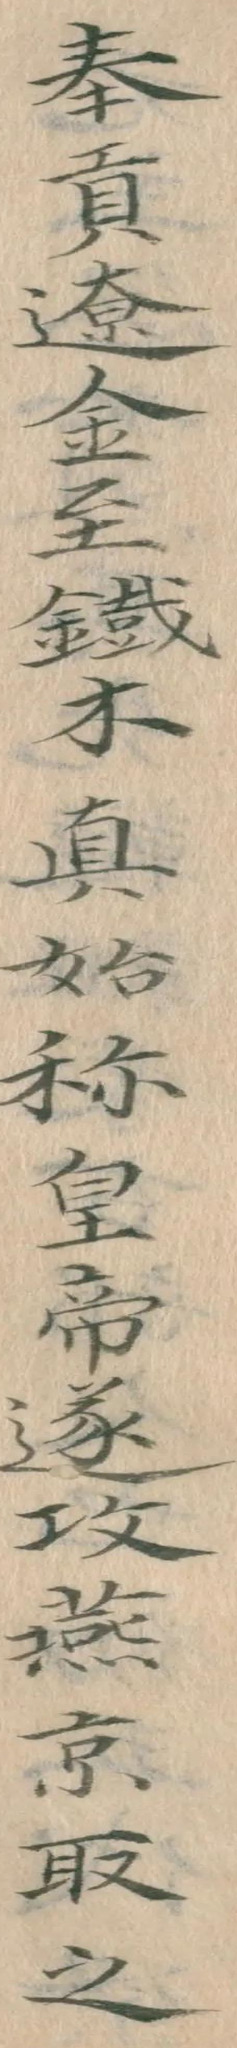奉貢遼金至鉄木真始称皇帝遂攻燕京取之
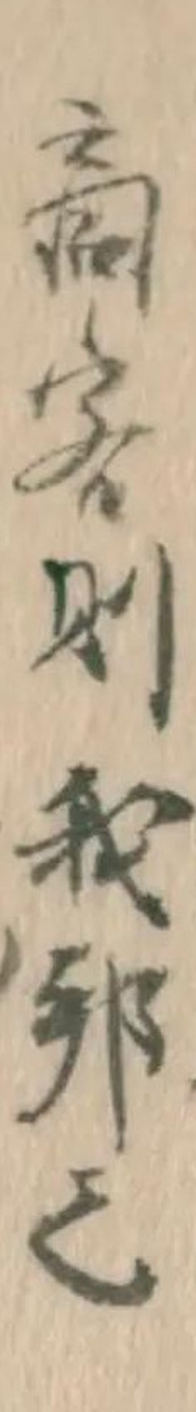商客則我邦也
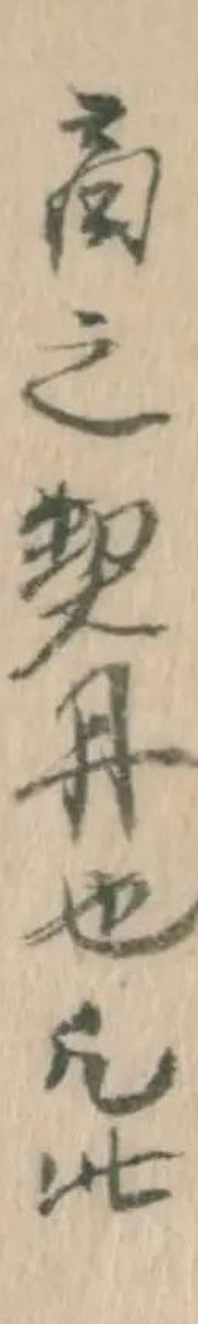商也契丹也凡此
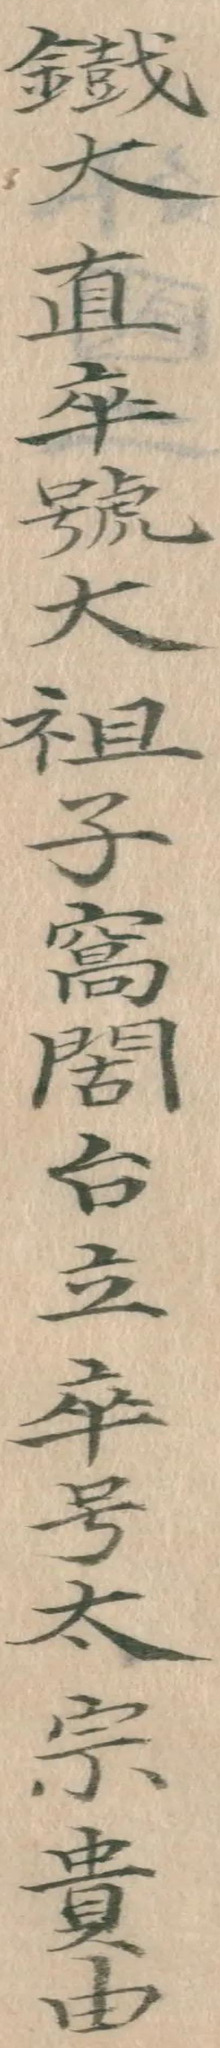鉄大直卒号大祖子窩台立卒号太宗貴由
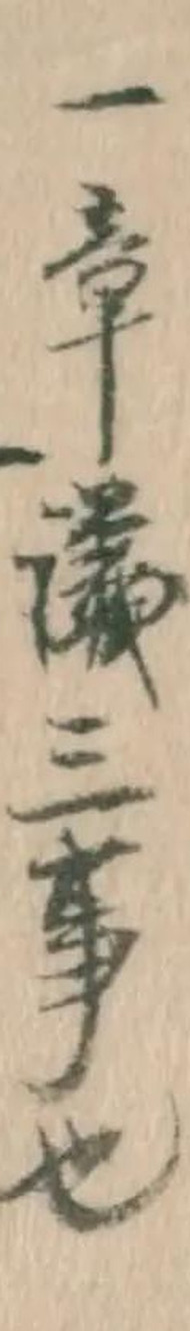一章議三事也
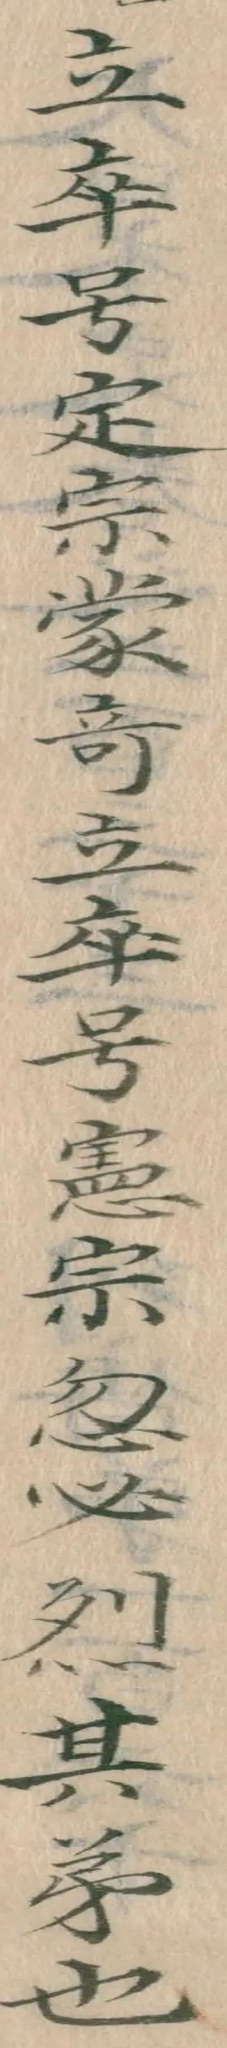立卒号定宗蒙奇立卒号憲宗忽必烈其弟也
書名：輪池叢書. 12
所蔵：国立国会図書館 National Diet Library, JAPAN
